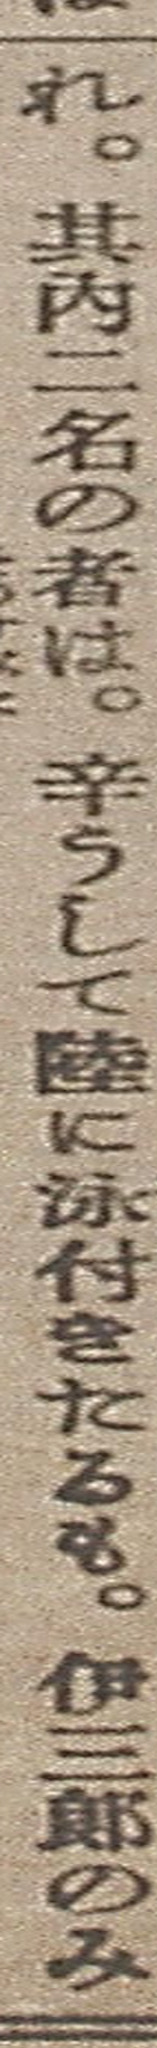れ。其内二名の者は。辛うして陸に泳付きたるも。伊三郎のみ
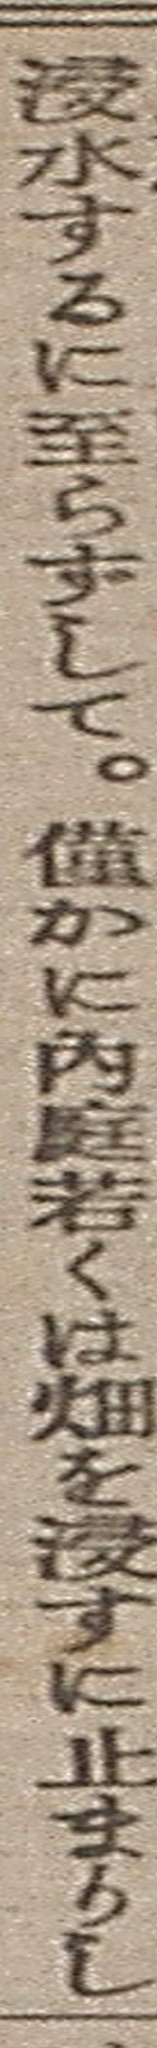浸水するに至らずして。僅かに内庭若くは畑を浸すに止まりし
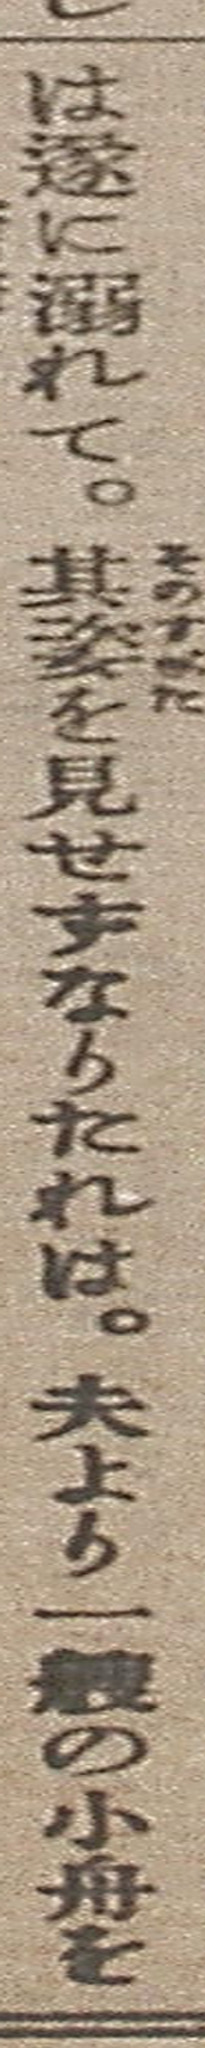は遂に溺れて。其姿を見せずなりたれは。夫より一艘の小舟を
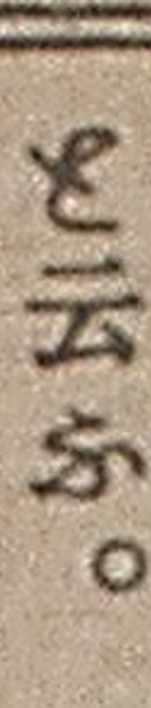と云ふ。
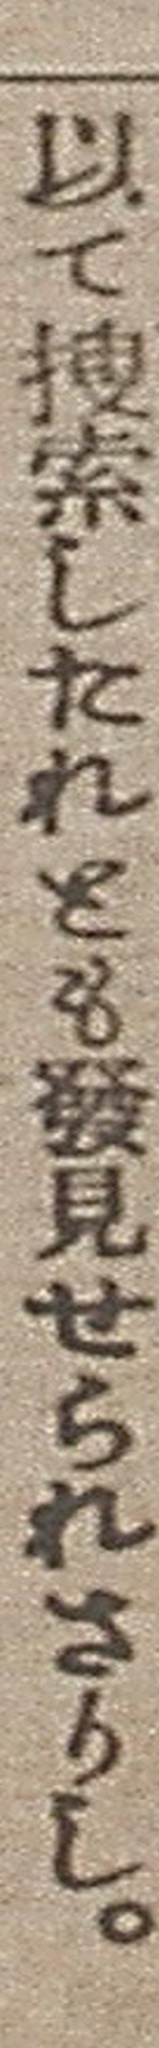以て捜索したれとも発見せられさりし。
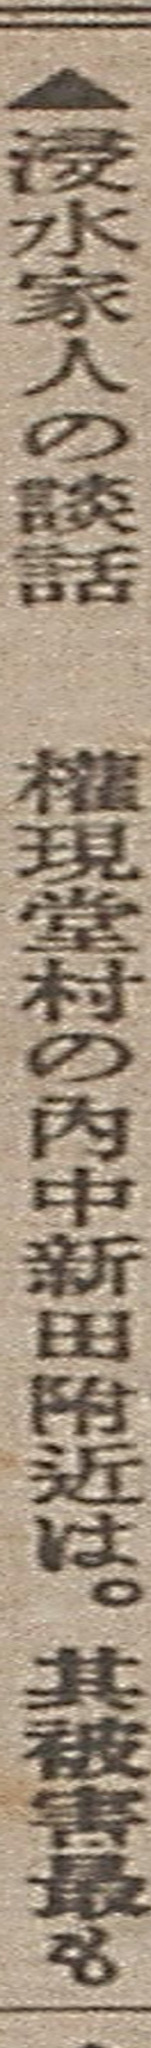▲浸水家人の談話権現堂村の内中新田付近は。其被害最も
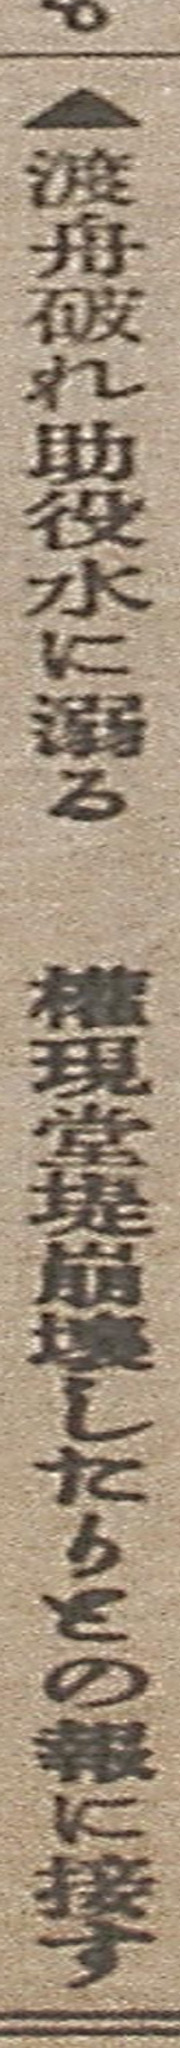▲渡舟破れ助役水に溺る権現堂堤崩壊したりとの報に接す
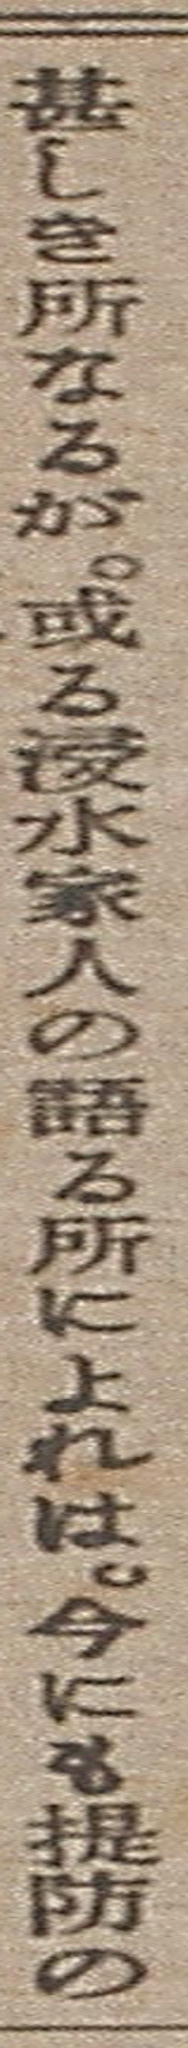甚しき所なるが。或る浸水家人の語る所によれは。今にも堤防の
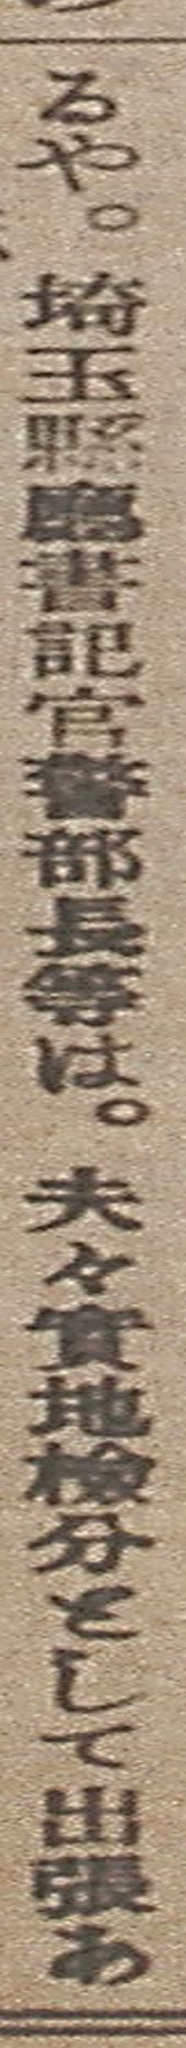るや。埼玉県庁書記官警部長等は。夫々実地検分として出張あ
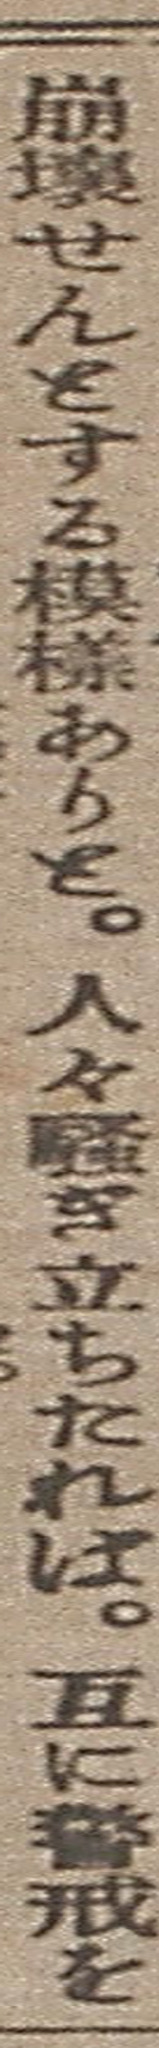崩壊せんとする模様ありと。人々騒ぎ立ちたれば。互に警戒を
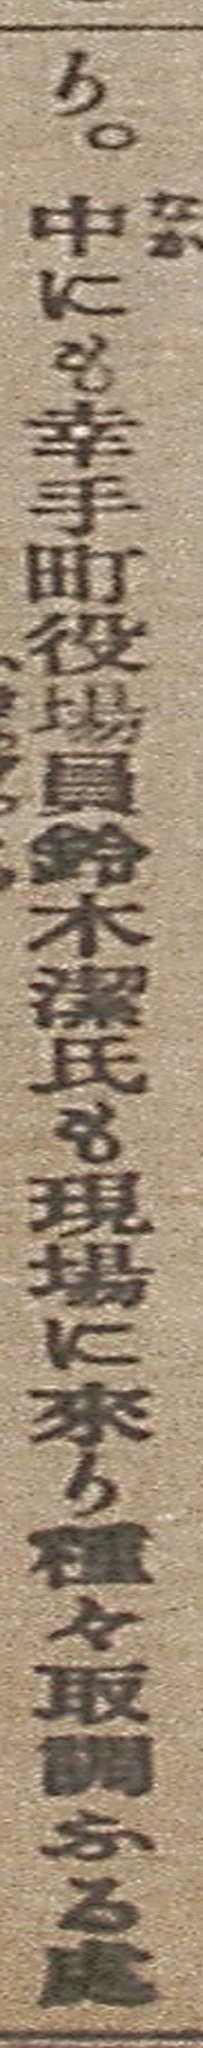り。中にも幸手町役場員鈴木潔氏も現場に来り種々取調ふる処
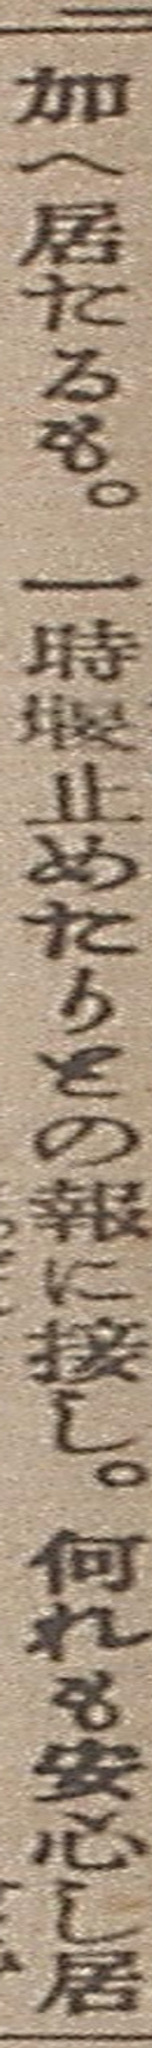加へ居たるも。一時堰止めたりとの報に接し。何れも安心し居
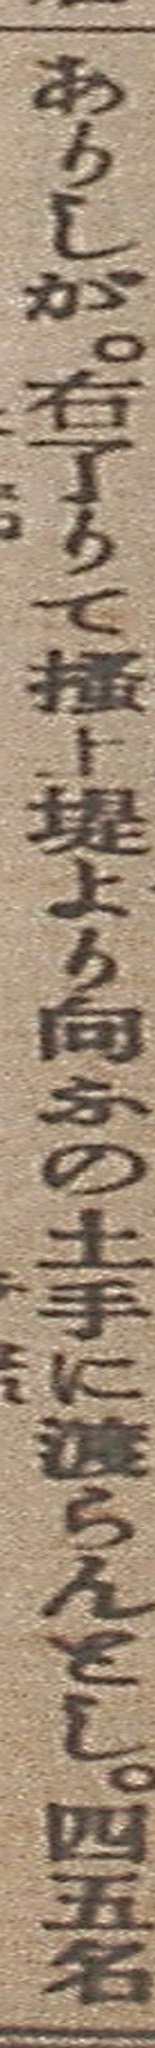ありしが。右了りて掻上堤より向ふの土手に渡らんとし。四五名
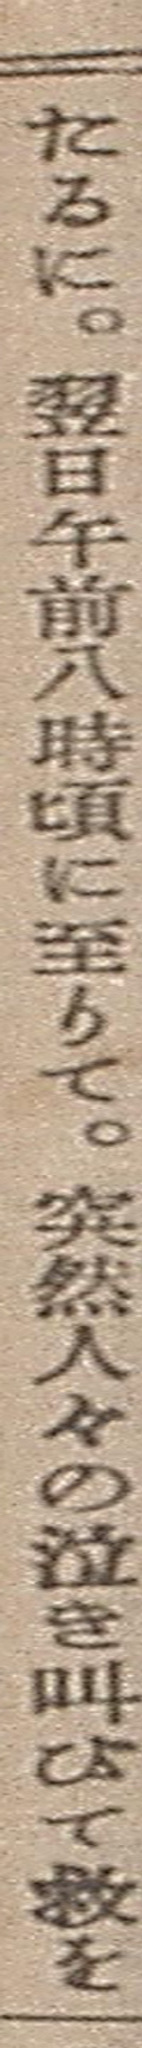たるに。翌日午前八時頃に至りて。突然人々の泣き叫びて救を
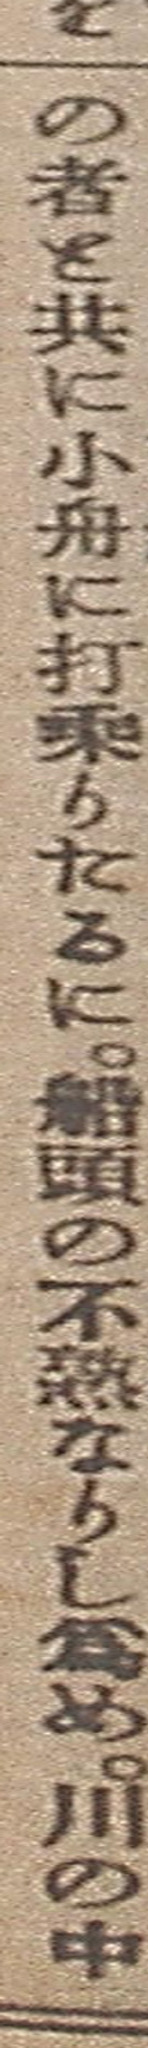の者と共に小舟に打乗りたるに。船頭の不熟なりし為め。川の中
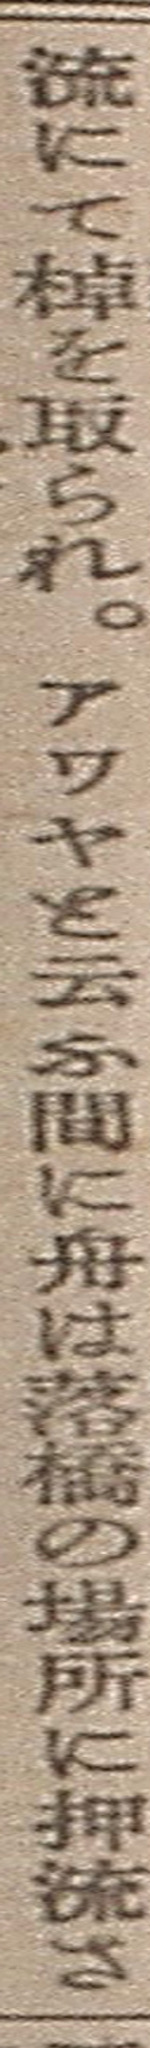流にて棹を取られ。アワヤと云ふ間に舟は落橋の場所に押流さ
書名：風俗畫報臨時増刊第百九十九號　明治三十二年十月各地災害圖會（前編之續）
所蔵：東京大学地震研究所図書室 Earthquake Research Institute Library, The University of Tokyo, JAPAN
